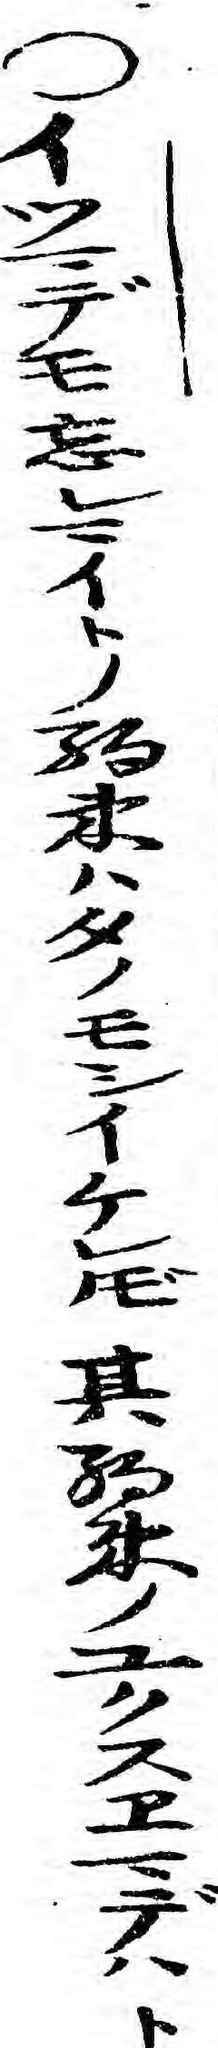○イツマデモ忘レマイトノ約束ハタノモシイケレドモ其約束ノユクスヱマデハト
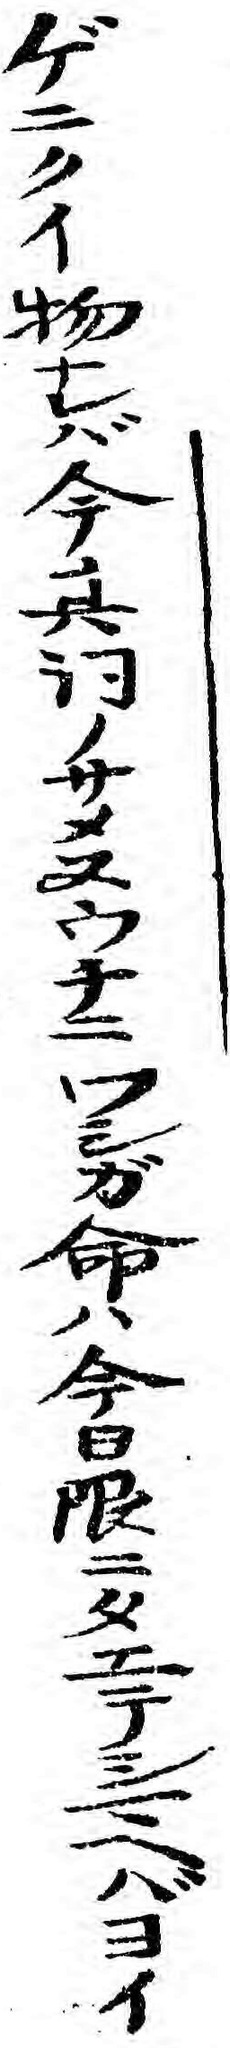ゲニクイ物ナレバ今其詞ノサメヌウチニワシガ命ハ今日限ニタエテシマヘバヨイ
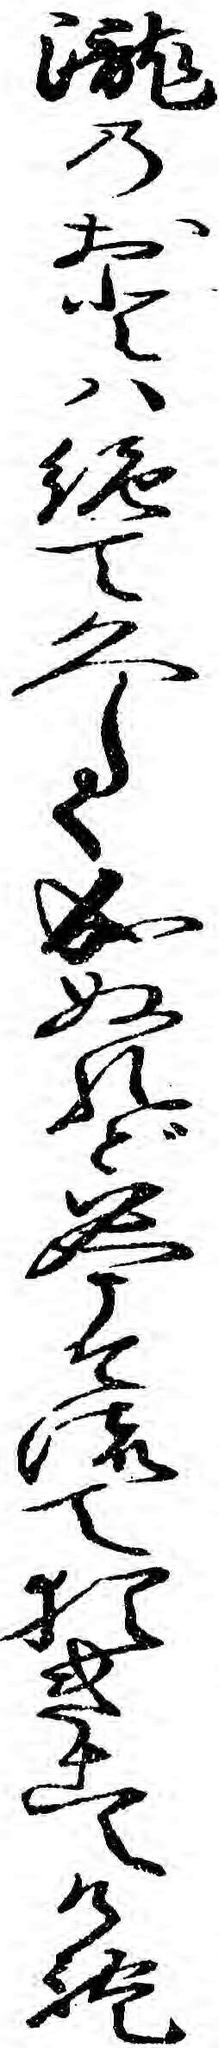瀧のおとは絶て久しく成ぬれど名こそ流て猶聞こえけれ
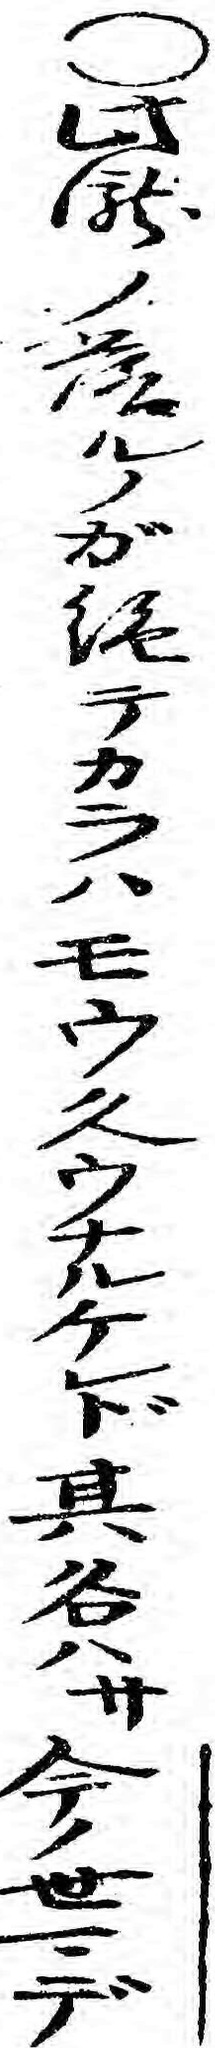○此瀧ノ落ルノガ絶テカラハモウ久ウナルケレド其谷ハサ今ノ世マデ
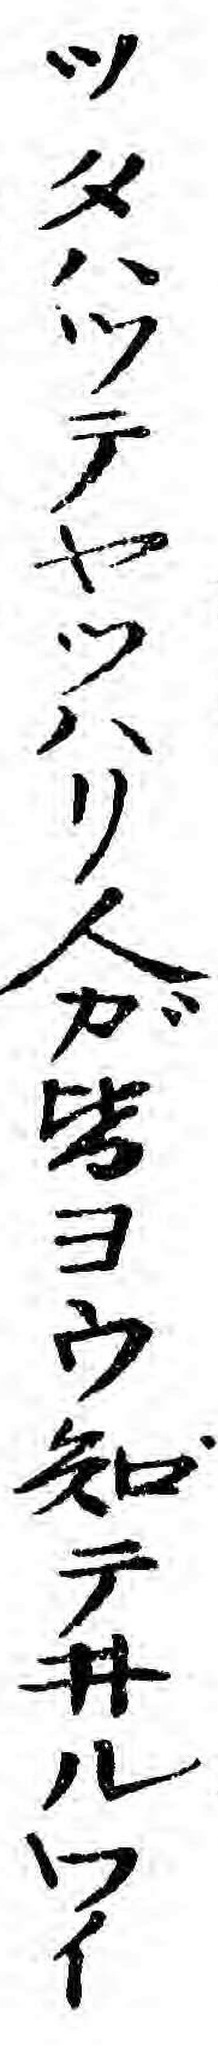ツタハツテヤツハリ人ガ皆ヨウ知テヰルワイ
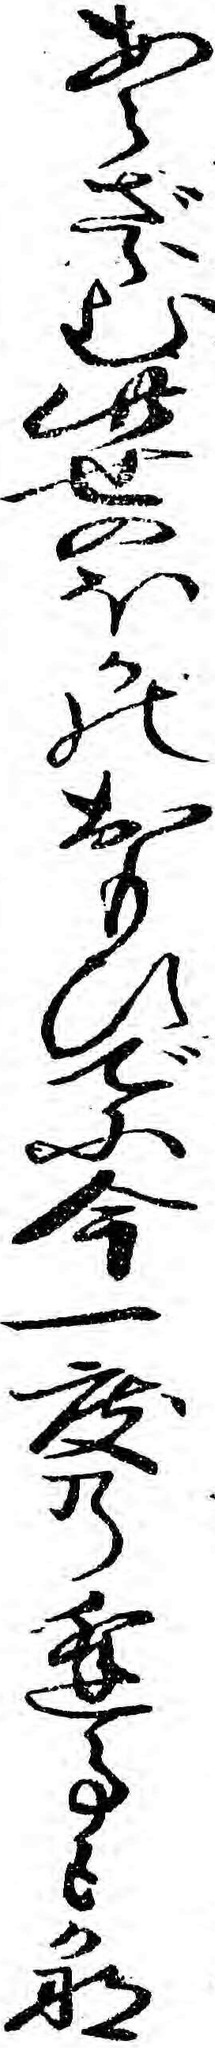あらざらむ此世のほかのおもひでに今一度の逢事もかな
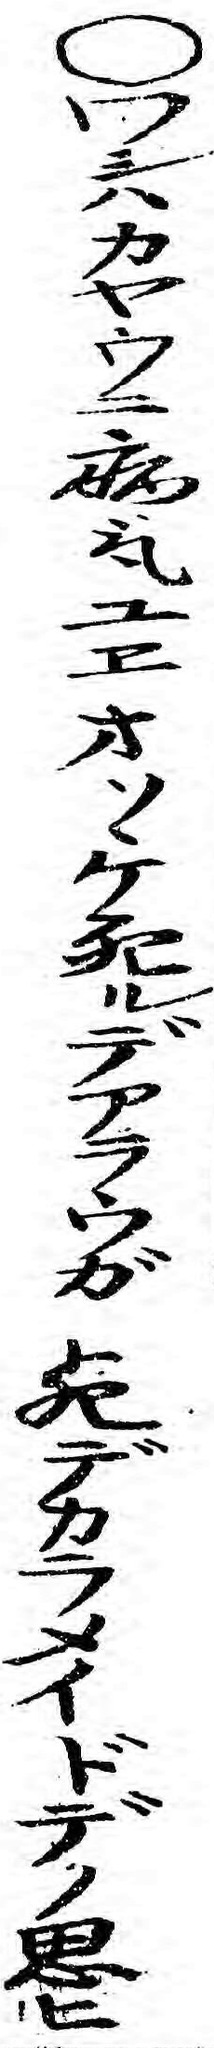○ワシハカヤウニ病気ユヱオツヽケ死ルデアラウガ死デカラメイドデノ思ヒ
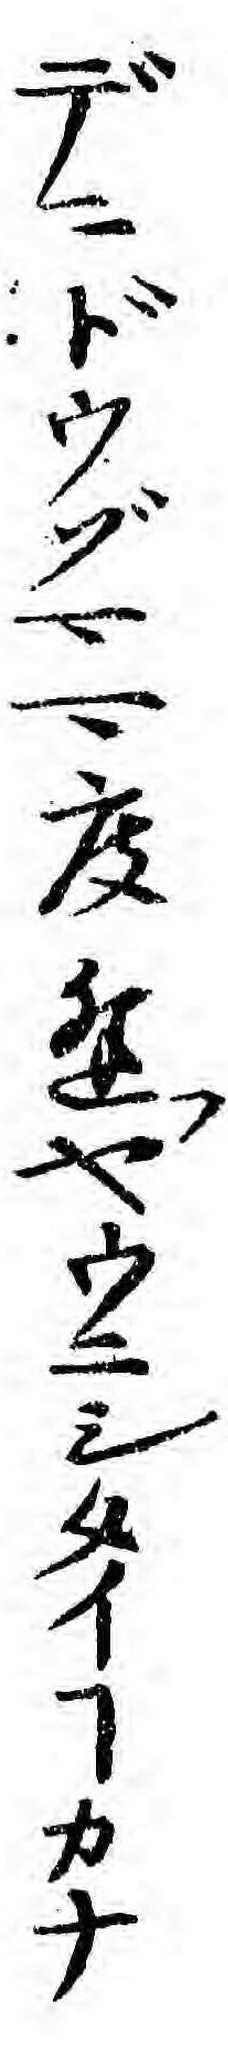デニドウゾママ度逢フヤウニシタイコトカナ
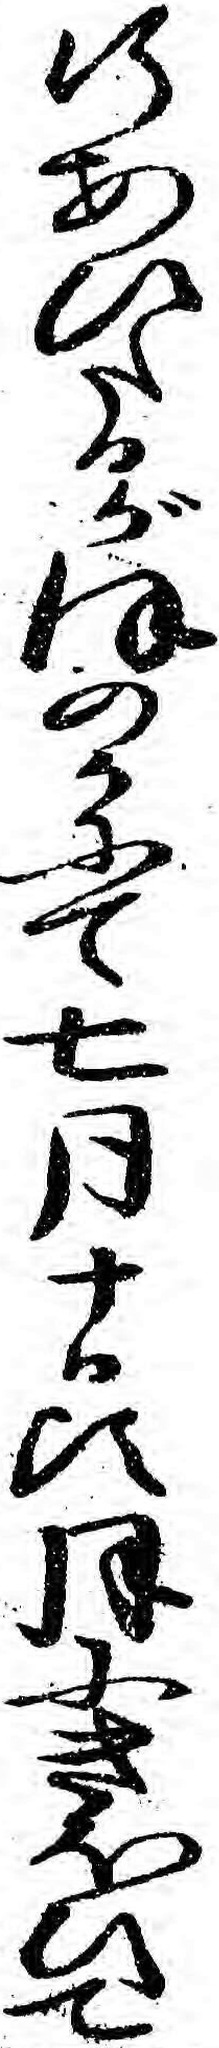行あひたるがほのかにて七月十日頃月にきほひて

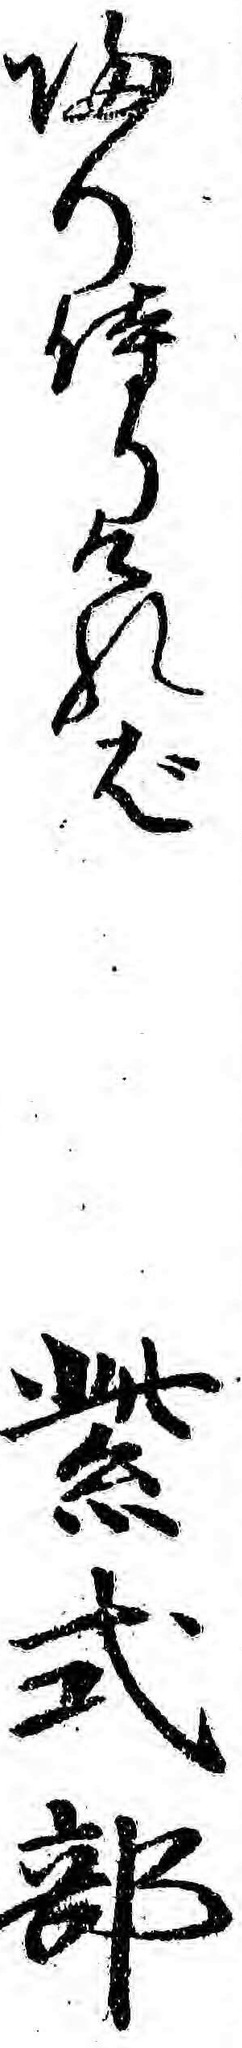帰り侍りければ紫式部
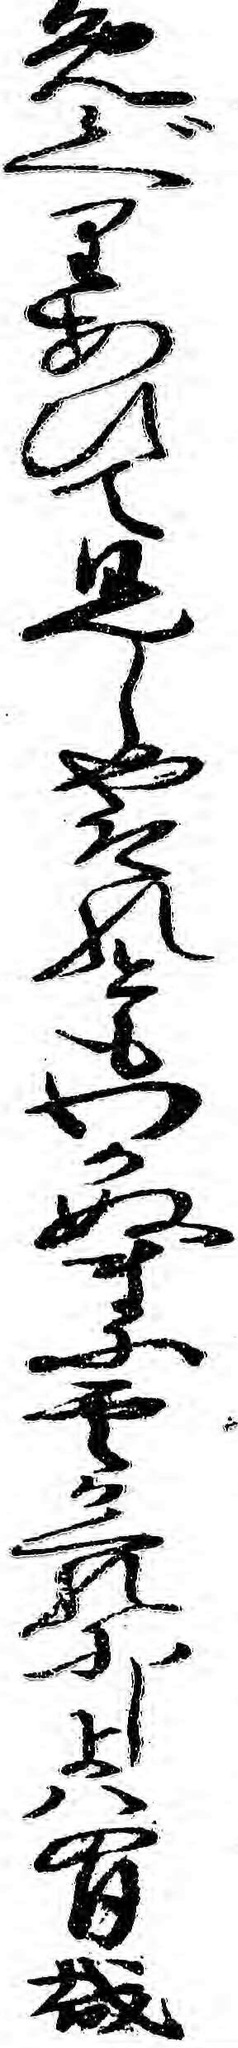めぐりあひて見しやそれともわかぬまに雲がくれにしよはの月哉
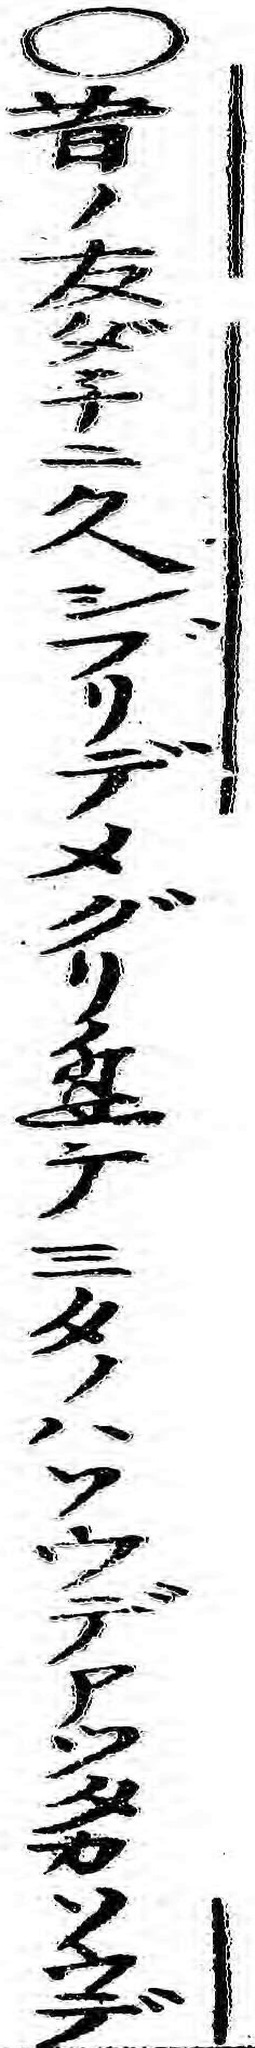○昔ノ友ダチニ久シブリデメグリ逢テミタノハソウデアツタカソウデ
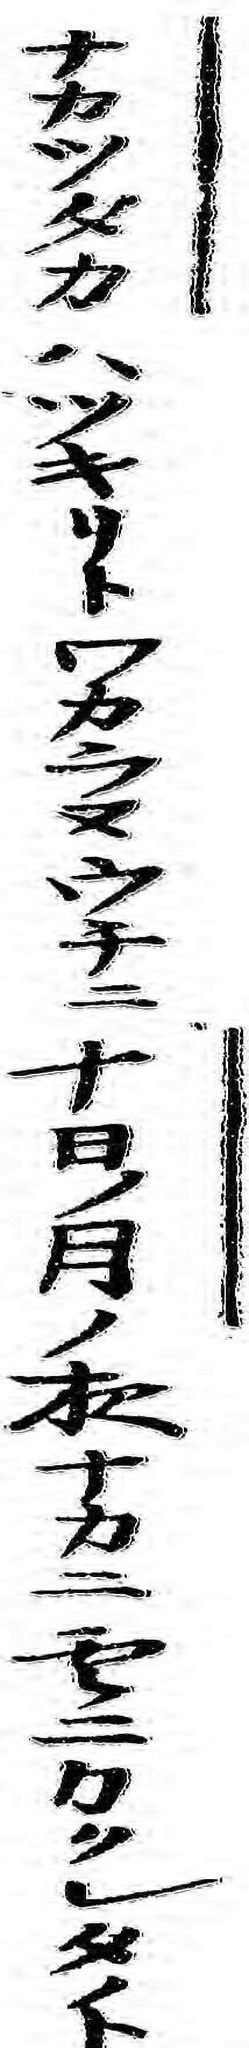ナカツタカハツキリトワカラヌウチニ十日ノ月ノ夜ナカニ雲ニカクレタノト
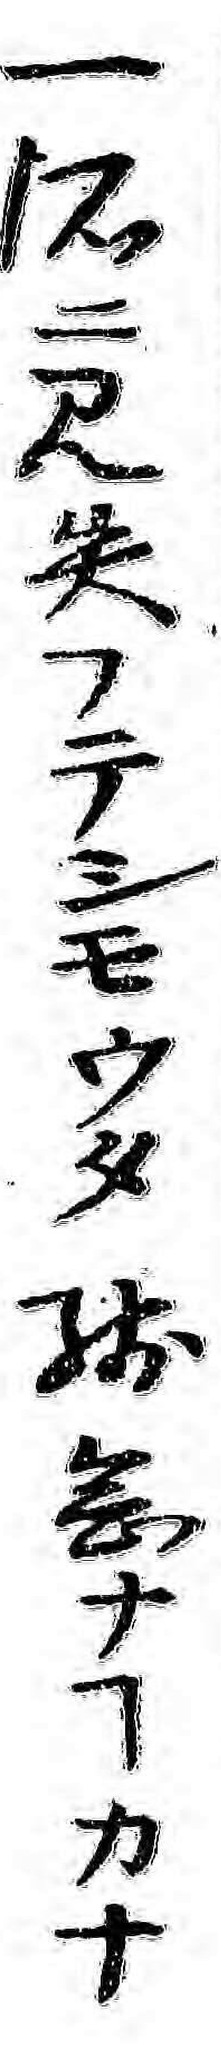一緒ニ見失フテシモウタ残念ナコトカナ
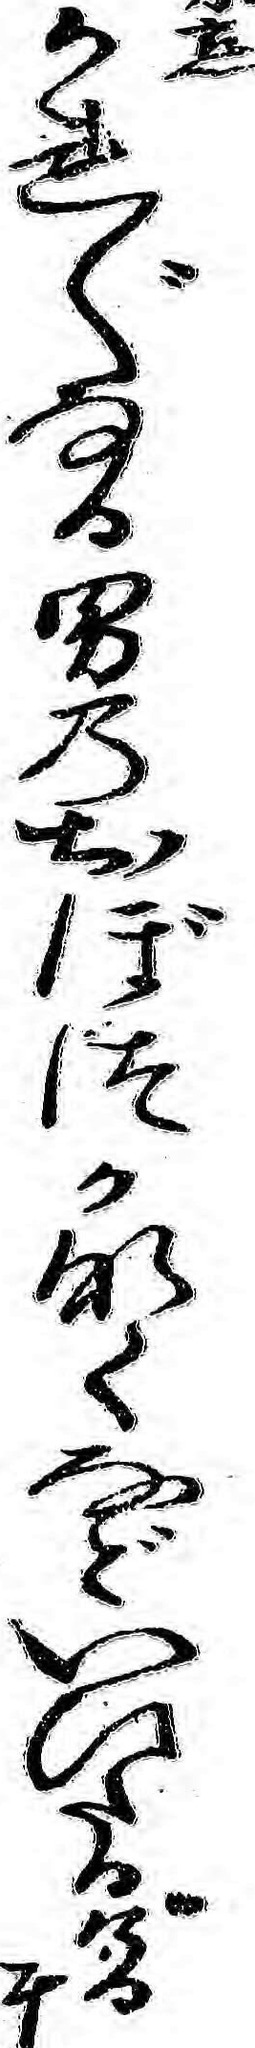後拾遺集恋かれ〴〵なる男のおぼつかなくなどいひたるけるに
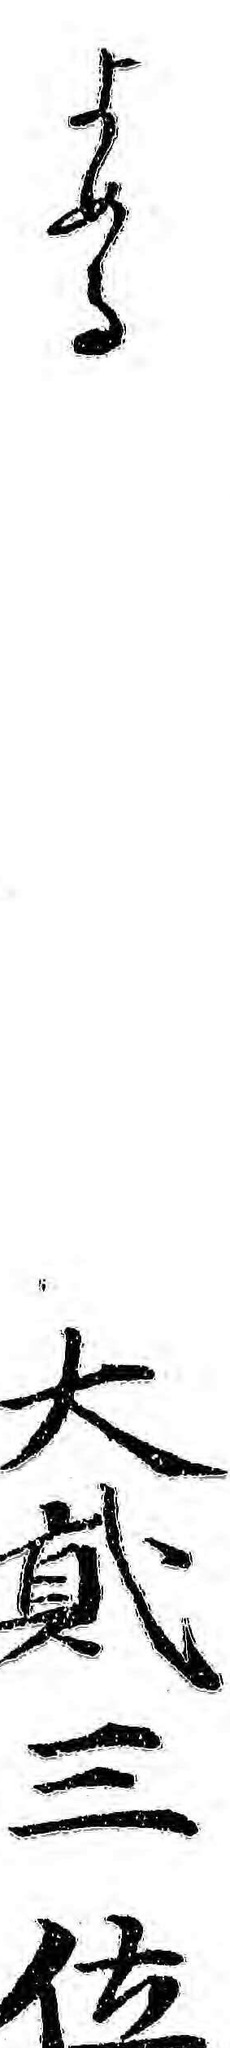よめる大貳三位
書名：百人一首／小倉の山ふみ
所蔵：国文学研究資料館
